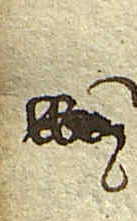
wen*
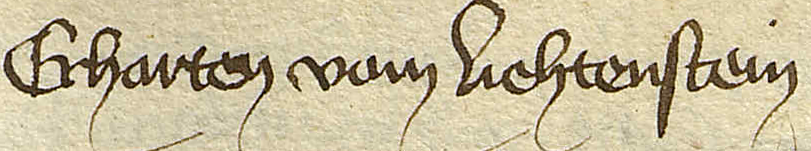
Erharten vom liehtenſtein
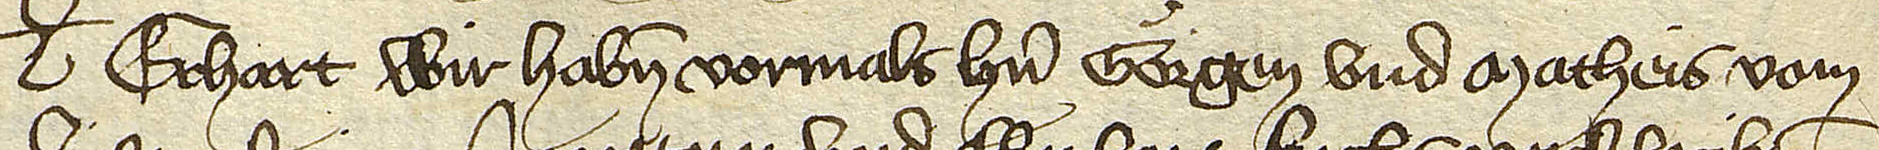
L* Erhart wir habn* vormals hn* Görgen vnd Matheis vom
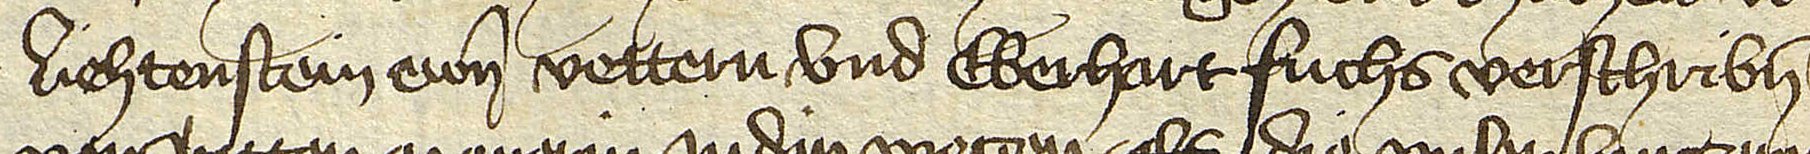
liehtenſtein ewn* vettern / vnd Eberhart fuchs verſchribn*
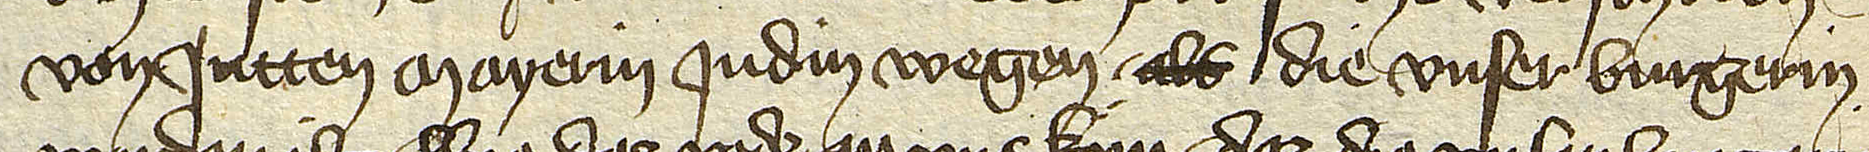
von Iutten Mayerin Iudin wegen / als die vnſer burgerin
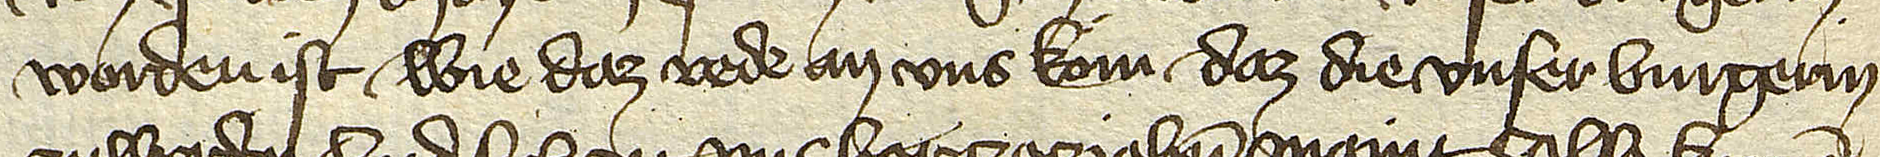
worden iſt / wie daʒ rede an vns köm / daʒ die vnſer burgerin
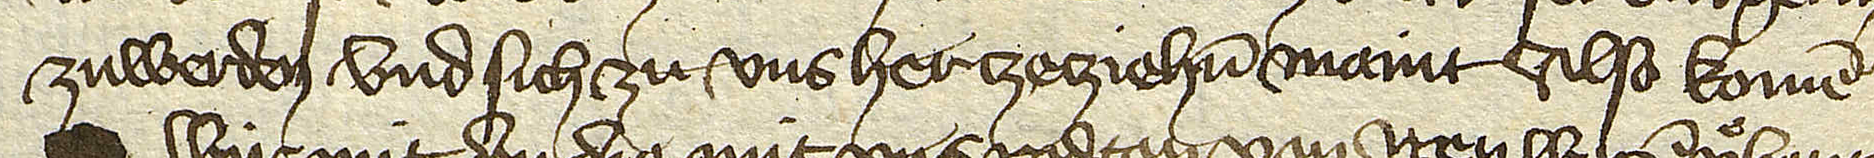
cʒuwerden / vnd ſich cʒu vns her cʒecʒiehn* maint Alſo kome*
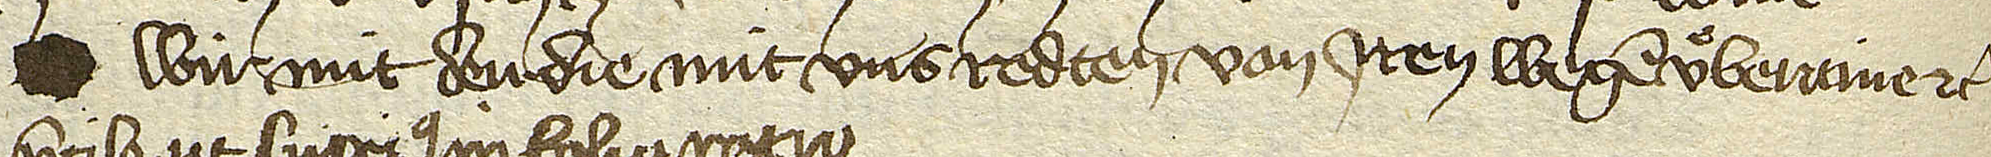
wir mit den die mit vns redten von Iren wege* vͤberaine ec*
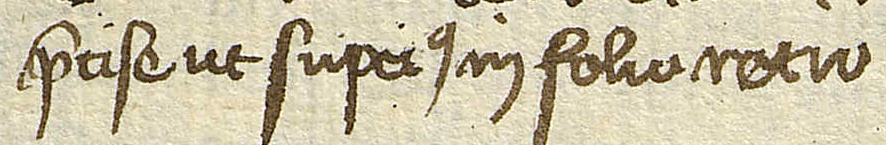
p*ciſe ut ſ%%%%* in folio retro
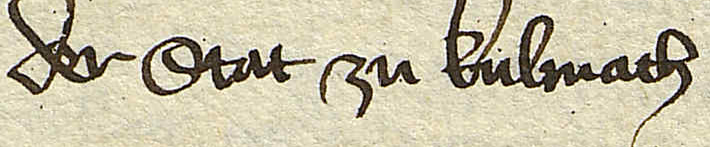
Der Stat cʒu Kulmach
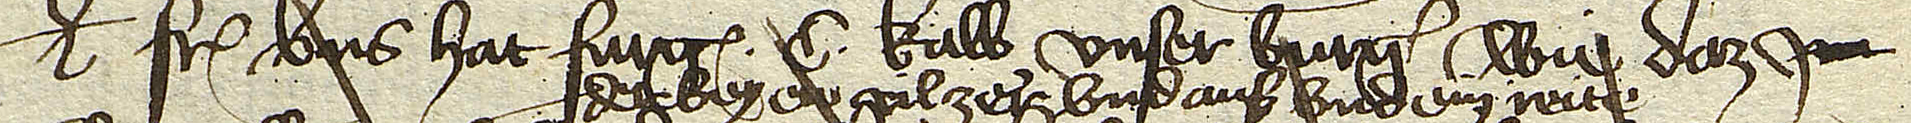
L* fr* / vns hat fürg* . C . Kalb vnſer burg* / wir daʒ Im
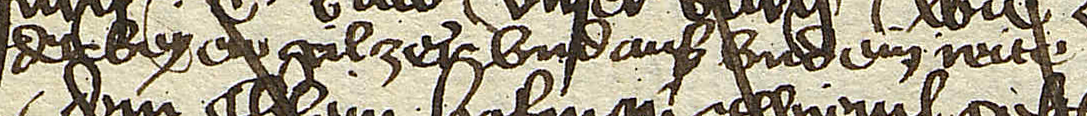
der bey ew vil cʒer vns auſʒ vns ein reite
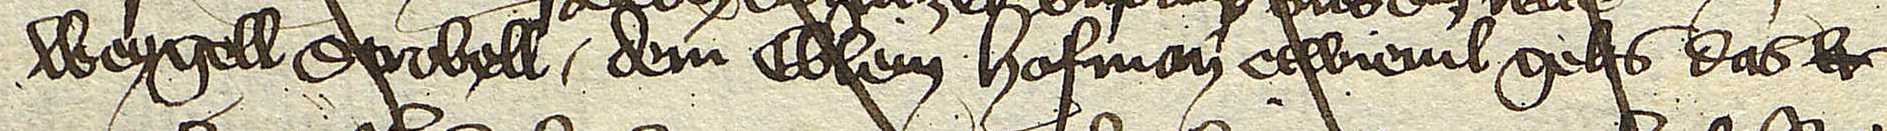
weygell Strobell / dem Eblein hofman etwieuil gelts das Er
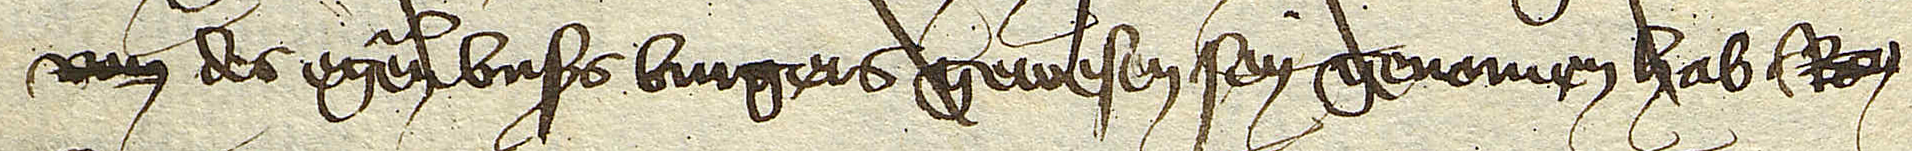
von der egen* vnſ*s burgers geweſen ſey genomen hab / Ro*
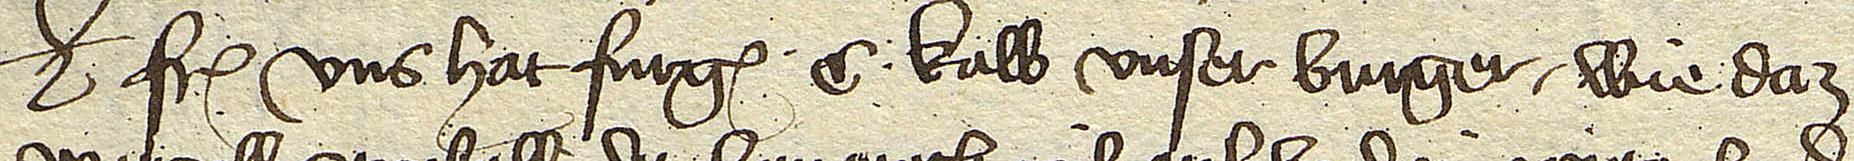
L* fr* vns hat fürg* C . Kalb vnſer burger / wie daʒ
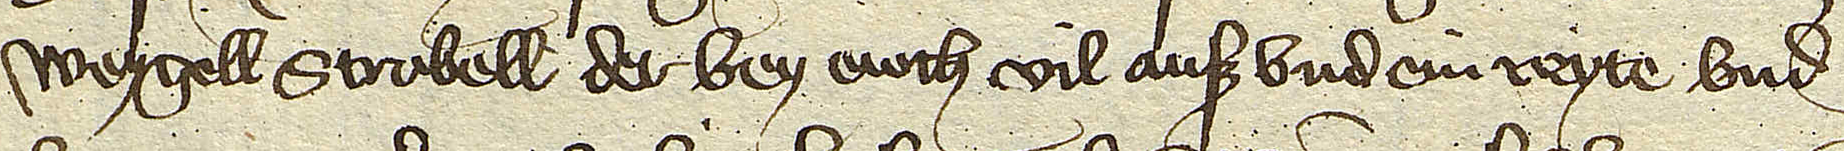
weygell Strobell der bey ewch vil auſʒ vnd ein reyte vnd
